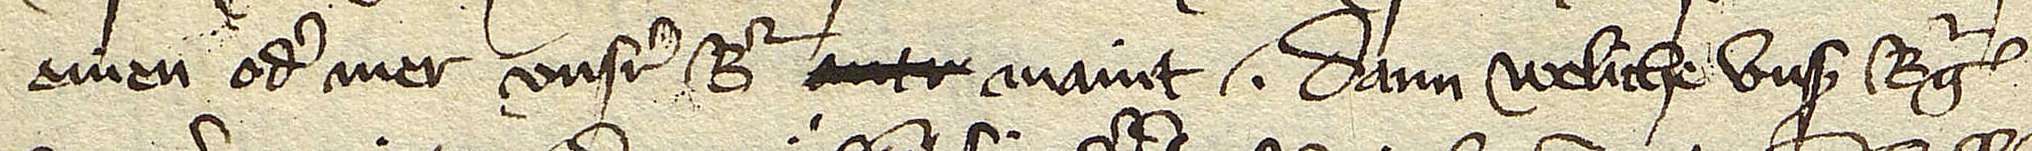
einen od* mer vnſr* B* antr maint / . Dann weliche vnſ* B*g*
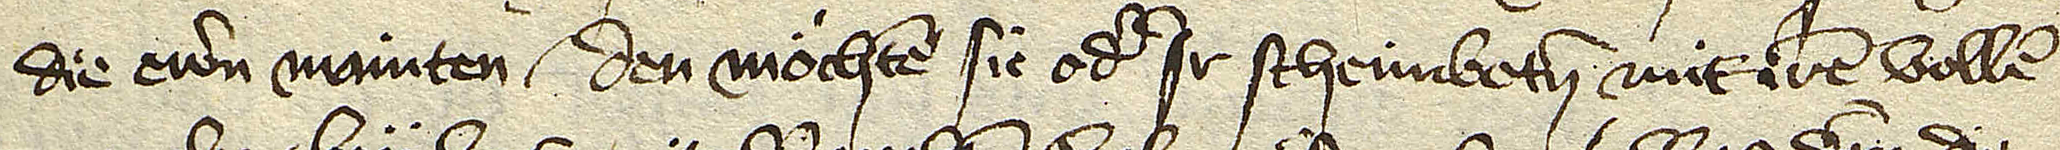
die ew*n mainten / den möchte* ſie od* Ir ſcheinbotn* mit ire* volle*
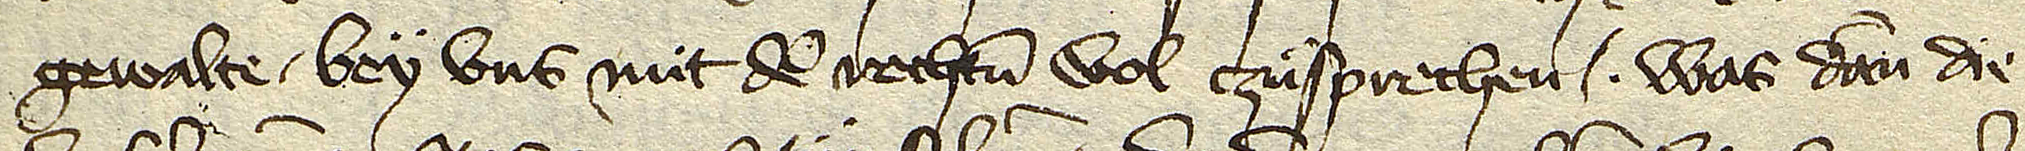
gewalte / bey vns mit d* rechtn* wol cʒüſprechen /. was dan* die
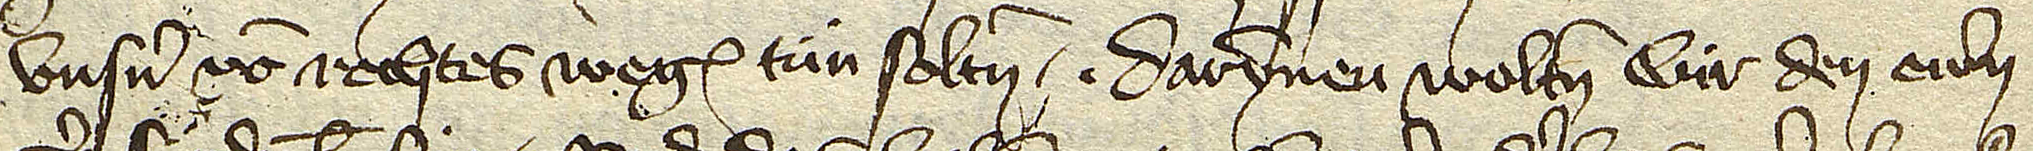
vnſ*n vo* rechtes weg* tün ſoltn* / . Dary*nen woltn* wir den ew*n
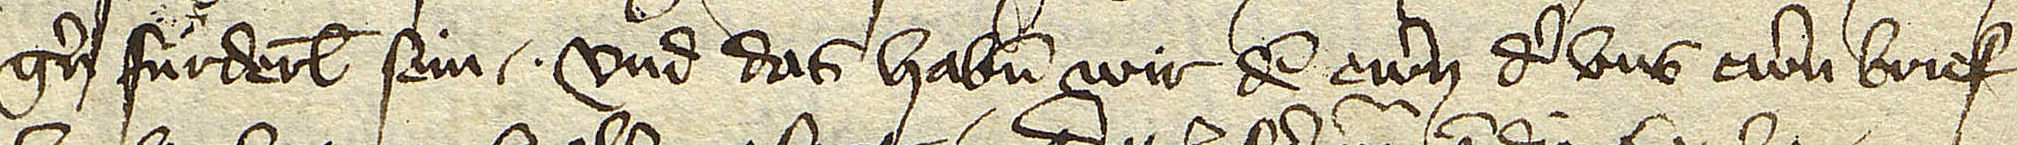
g*n fürderl* ſein / . vnd das habn* wir d* ew*n d* vns ew*n brief
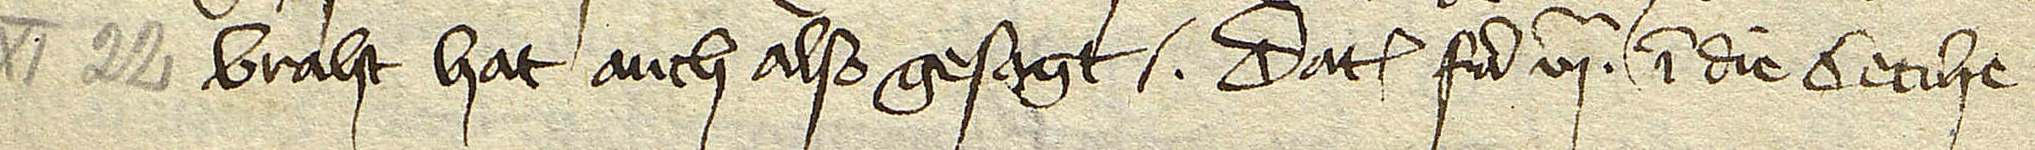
braht hat auch alſo geſagt / . Dat* fia* vi* . i* die Cetu*ie
